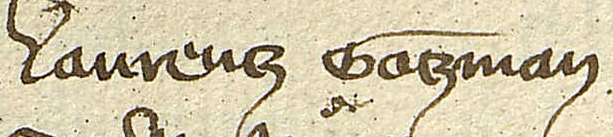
laurencʒ Gocʒman
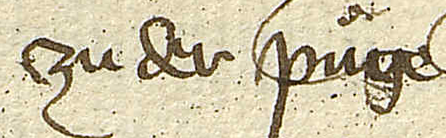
cʒu der Püge
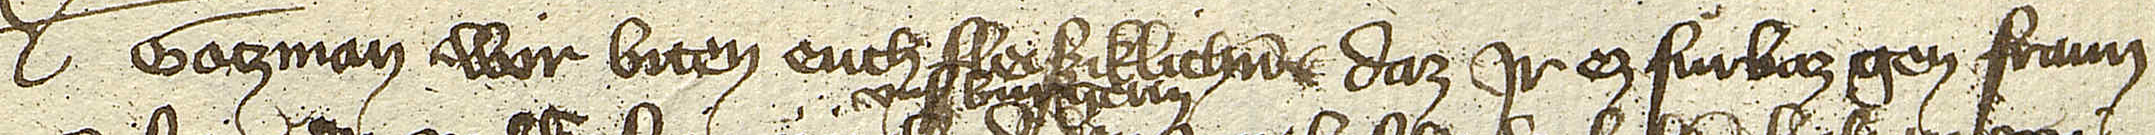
L* Gocʒman / Wir biten euch fleiſʒiklichn* / daʒ Ir eʒ fürbaʒ gen fraun
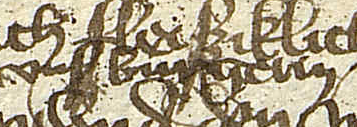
vnſ* Burgerin
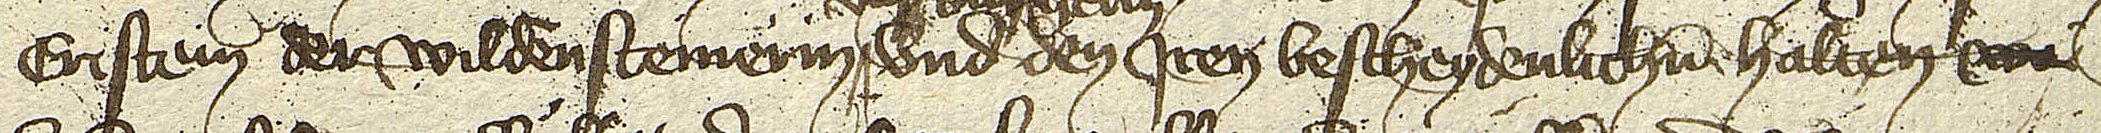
Criſtein der wildenſteinerin vnd den Iren beſcheydenlichn* halten wo
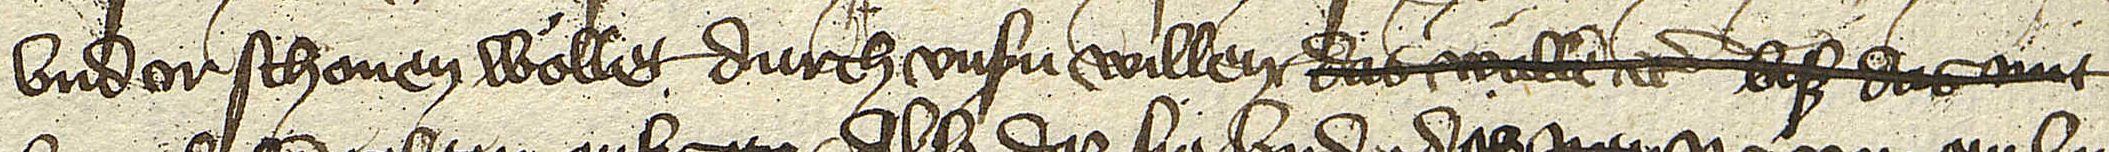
vnd ir ſchonen wöllet durch vnſ*n willen / das wölle* ec* biſʒ das mit
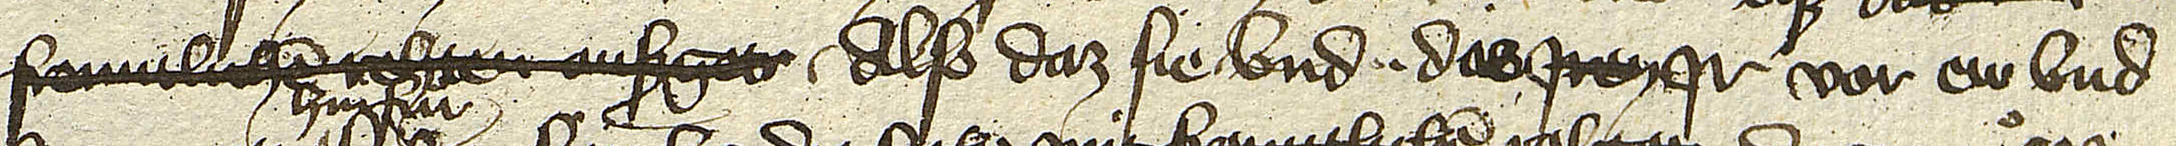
freuntliche* rehten auſʒgetr / Alſo daʒ ſie vnd ~ das Iren Ir vor ew vnd
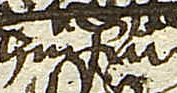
hinfür
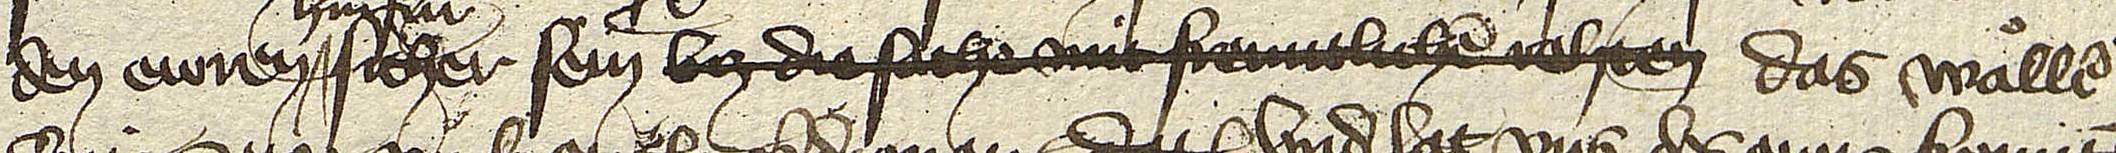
den ewren ſicher ſein biʒ die ſache mit freuntliche* rehten das wölle*
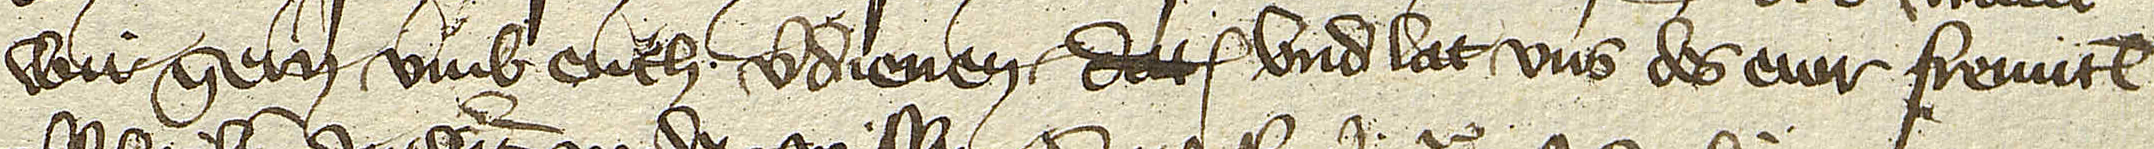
wir gern v̈mb euch v*dienen / dat* vnd lat vns des ewr freuntl*
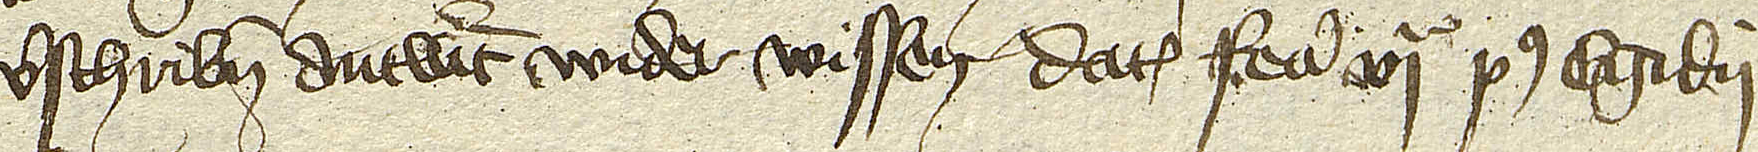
v*ſchribn* Antwt* wider wiſſen / Dat* fea* iii* p* Egidii
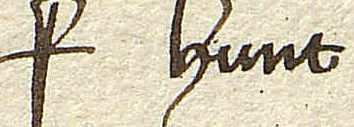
F Hunt
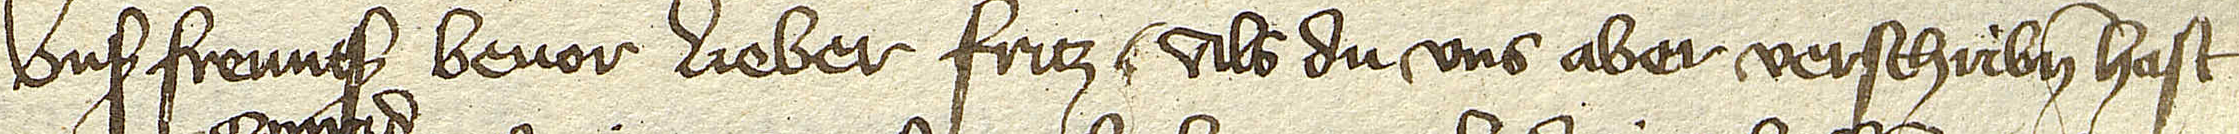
Vnſ* freuntſ* beuor lieber fricʒ / Als du vns aber verſchribn* haſt
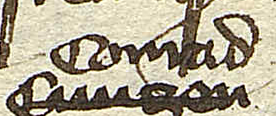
Conrad
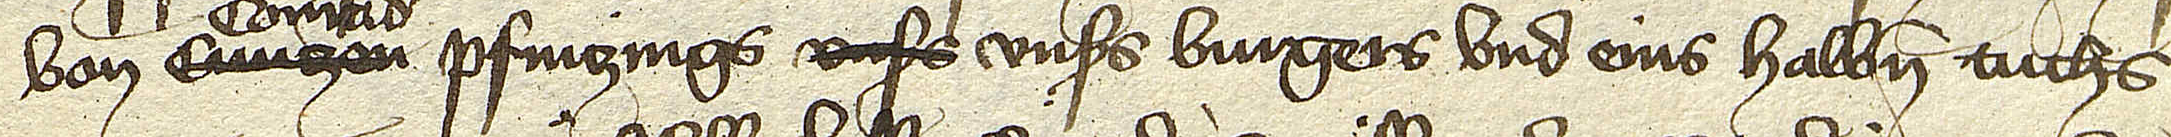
von Cuncʒen pfincʒings vnſ*s vnſ*s burgers vnd eins halbn* tuchs
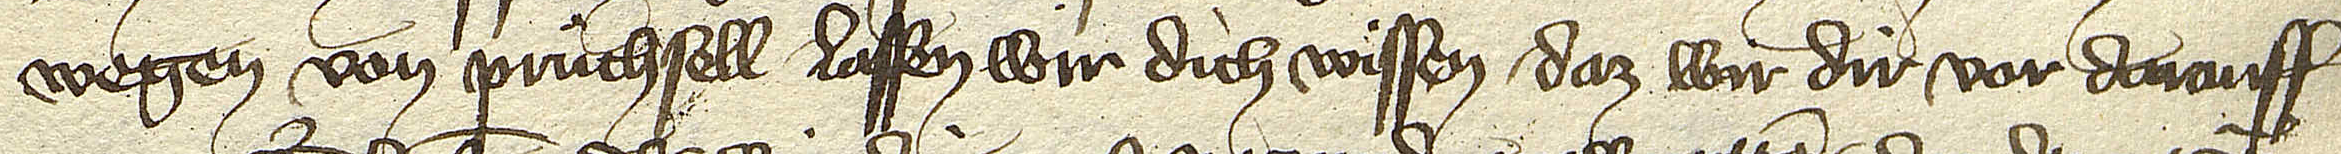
wegen von prüchſell / laſſen wir dich wiſſen / daʒ wir dir vor darauff
